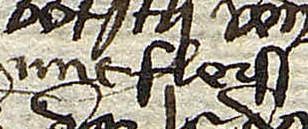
mit fleiſſ
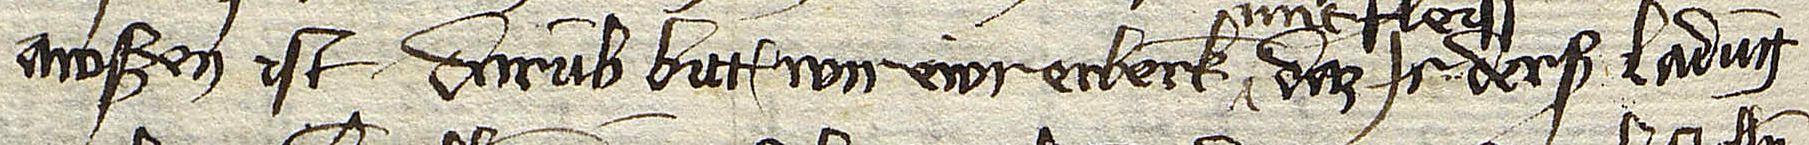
awſʒen iſt / Darub* bitt* wir eẅr erberk* daʒ Ir derſ* ladu*g
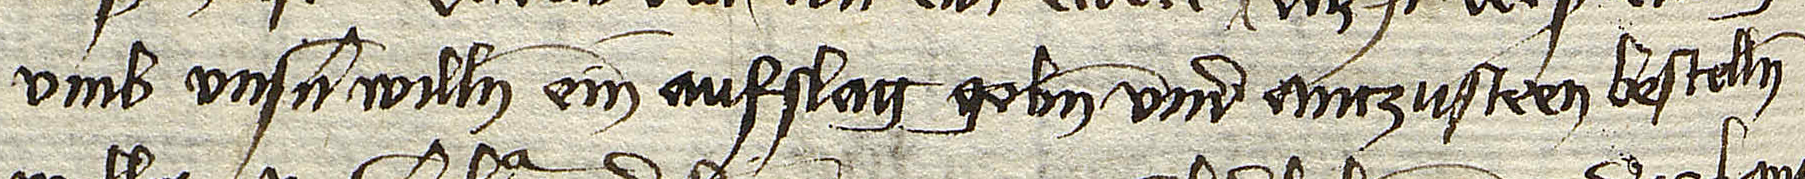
vmb vnſn* willn* ein aufslag gebn* vnd ancʒuſteen beſtelln*
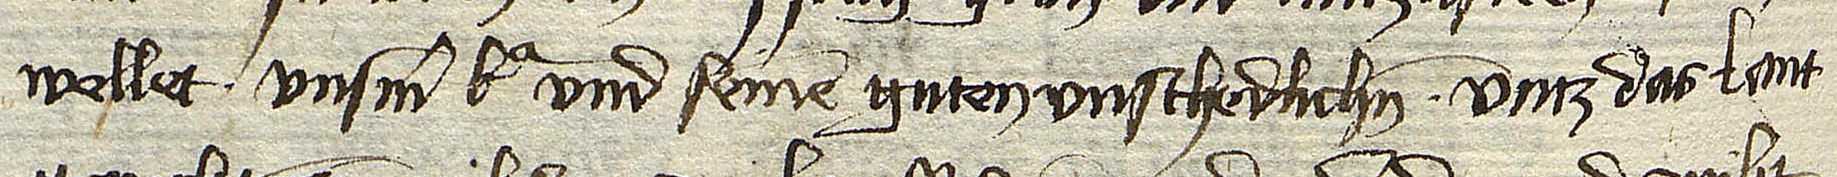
wellet . vnſm* b* vnd ſeine* guten vnſchedlichn* . vncʒ das lant
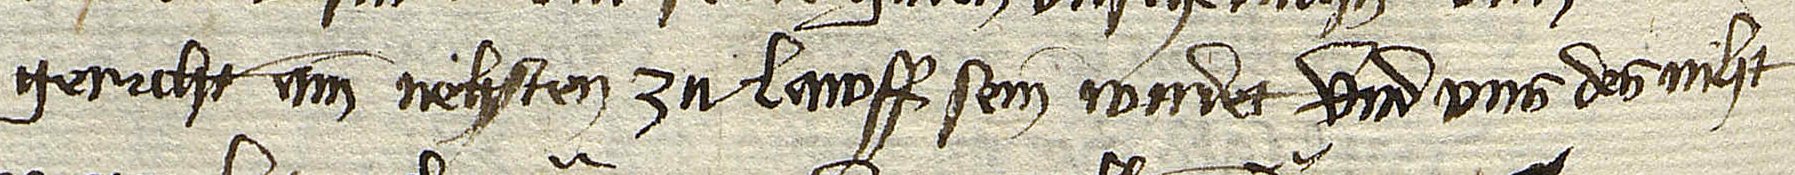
gericht am* nehſten ʒu lawff ſein wurdet Vnd vns des niht
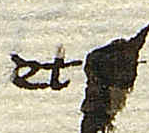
et
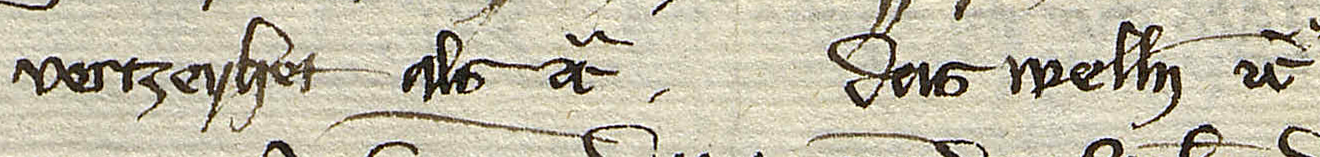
vercʒeyhet als ec* / das welln* ec*
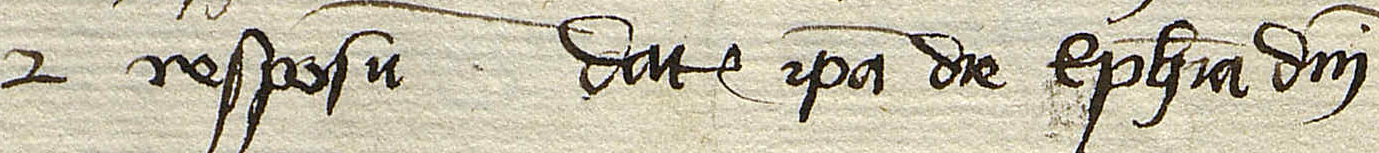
@ reſpoſu* Dat* ipa* die Eph*ia dni*
